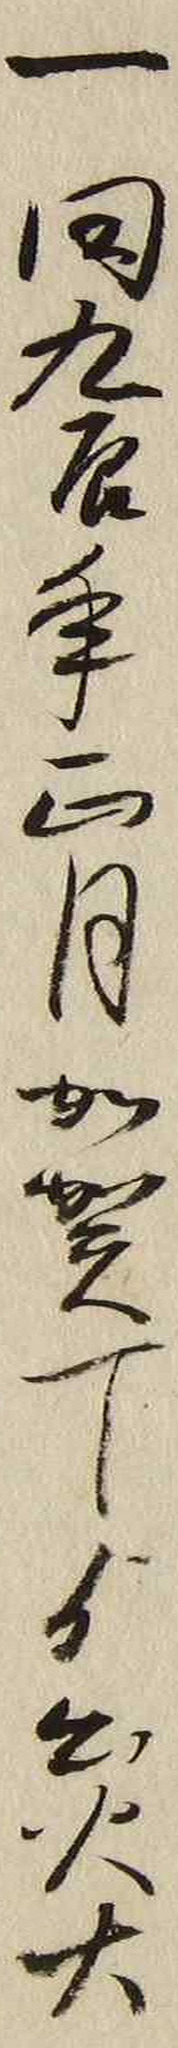一同九辰年正月加賀丁ゟ出火大
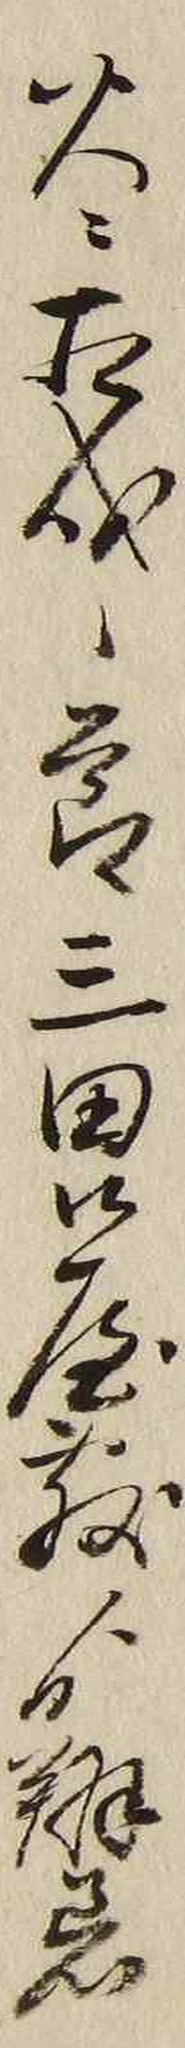火ニ相成候節三田御屋敷ゟ翔着

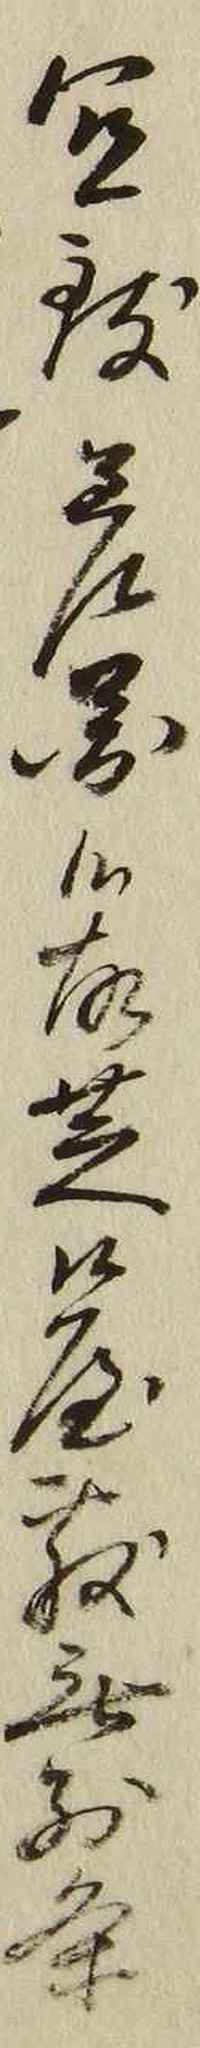宜致差図候故芝御屋敷無別条
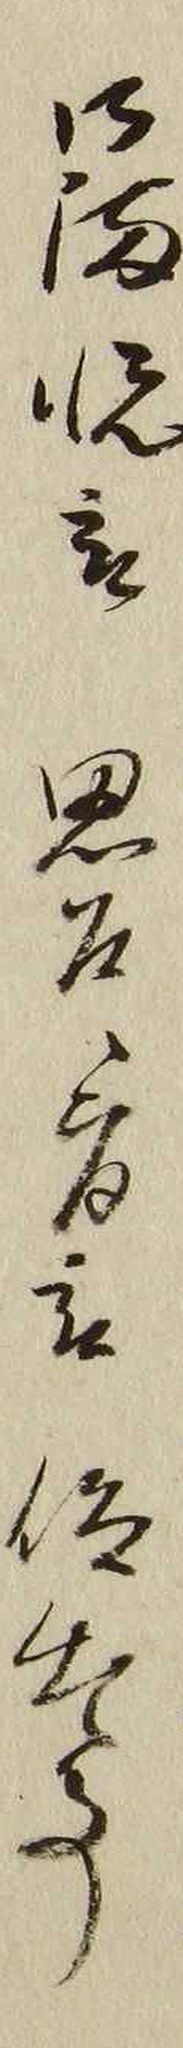御満悦被思召候旨被仰出候事
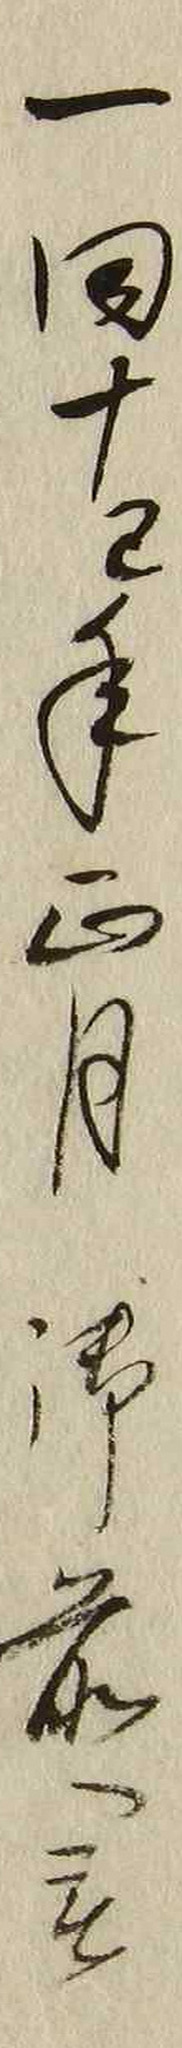一同十巳年正月御前へ被
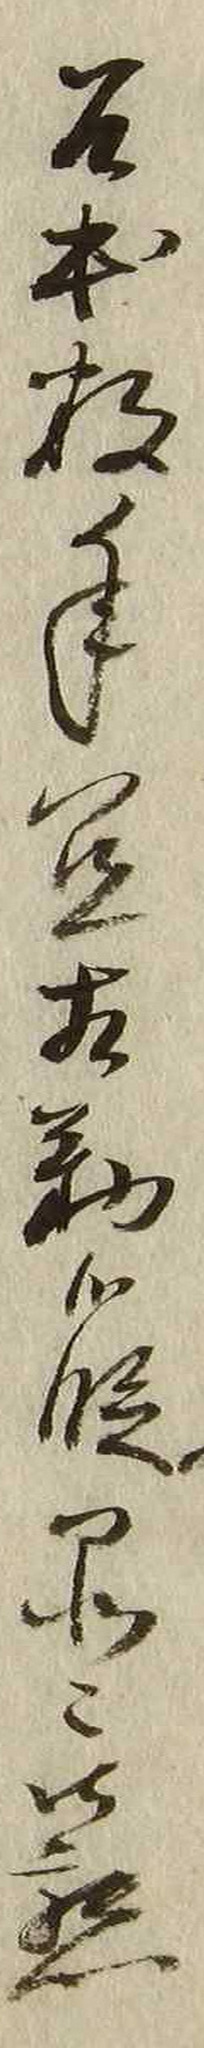召出数年宜相勤候段品々御懇
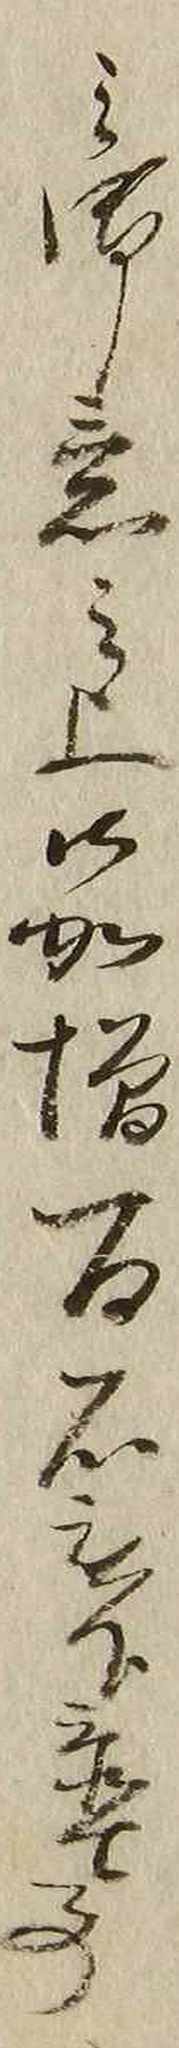之御意之上御加増百石被下置候事
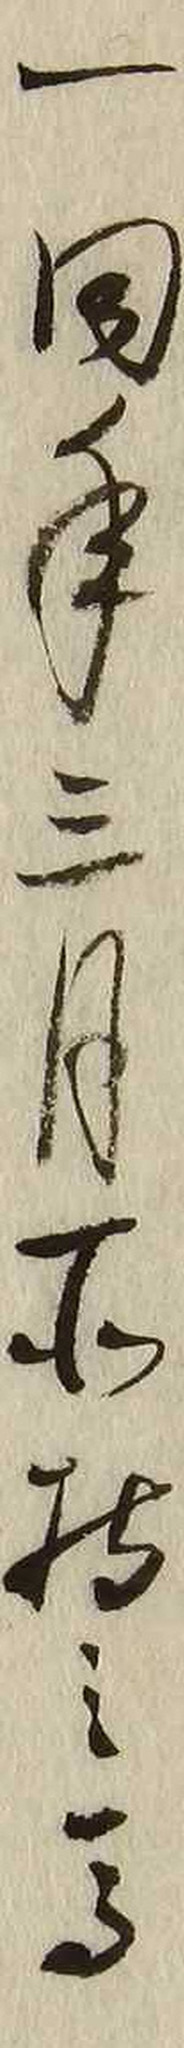一同年三月所持之馬
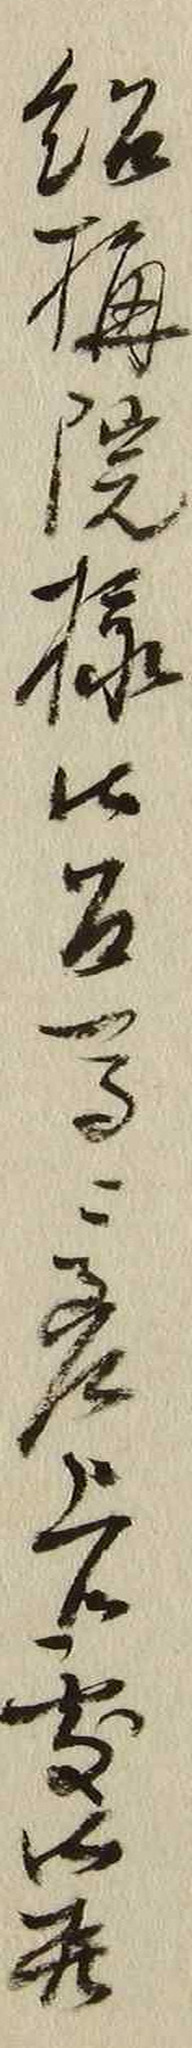紹栴院様御召馬ニ差上候処御喜
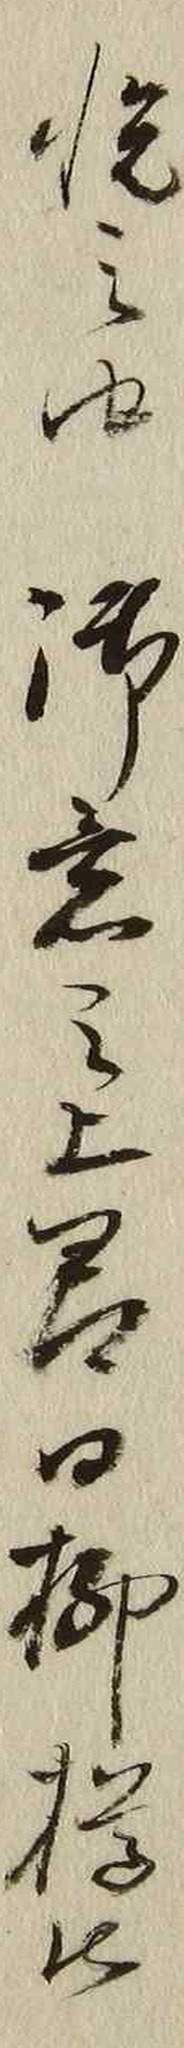悦之由御意之上即日柳樽御
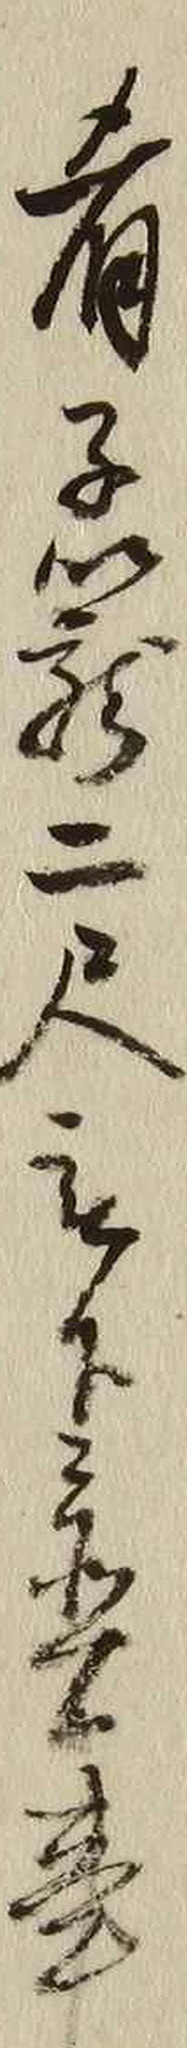肴子籠二尺被下置候事
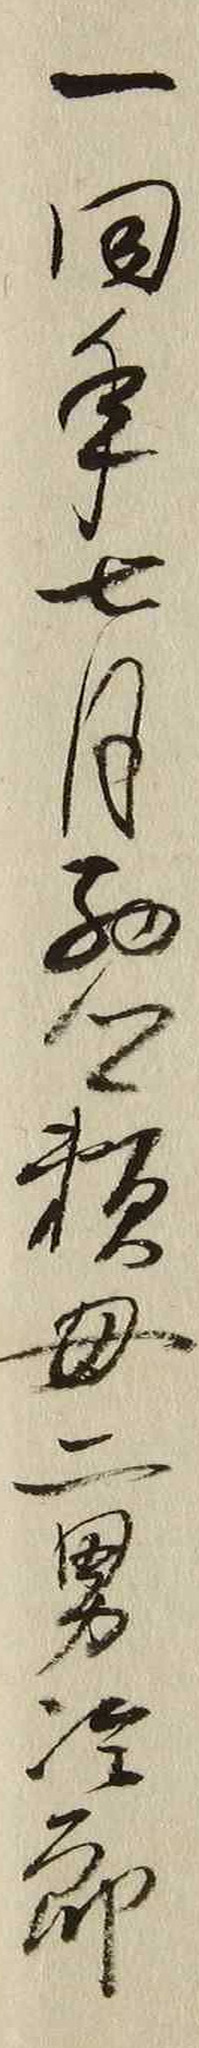一同年七月西郷頼母二男次郎
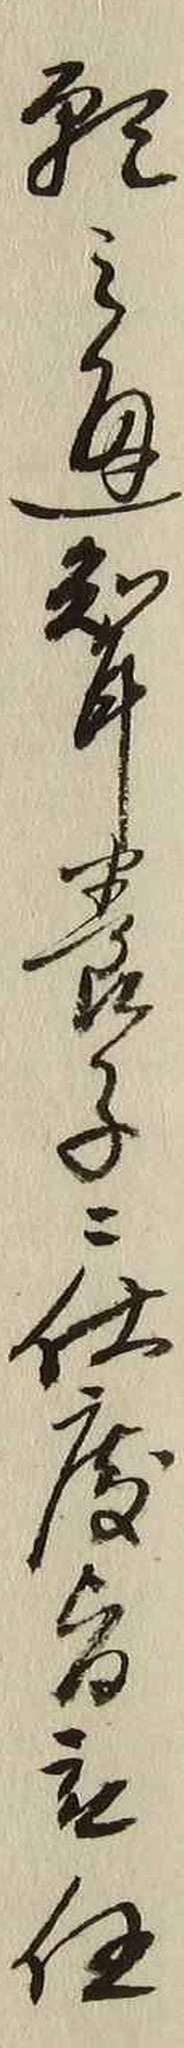願之通婿養子ニ仕度旨被任
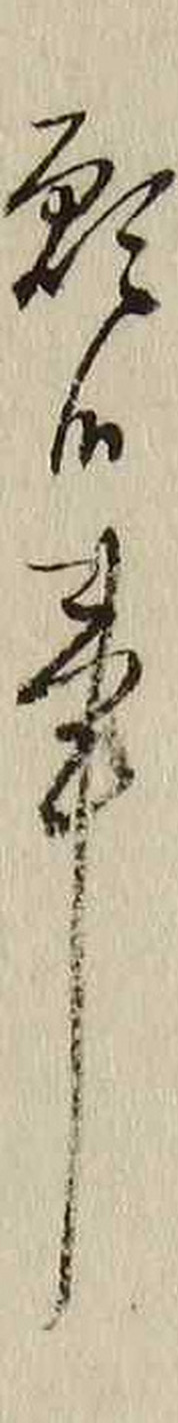願候事
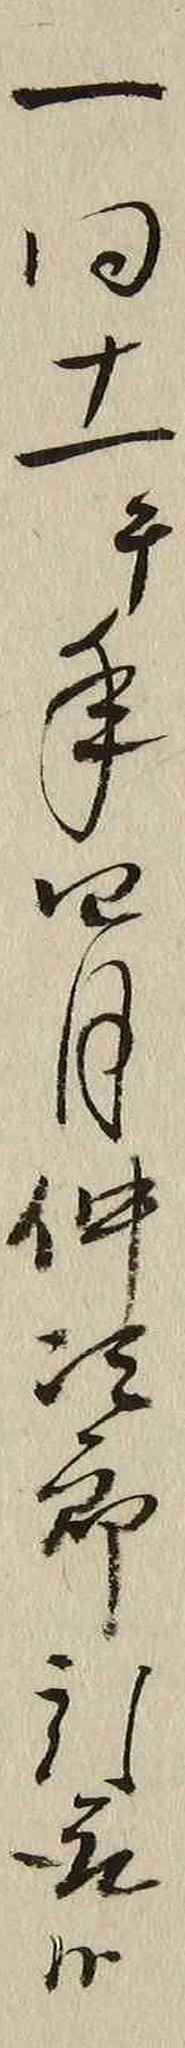一同十一午年四月仲次郎引取候
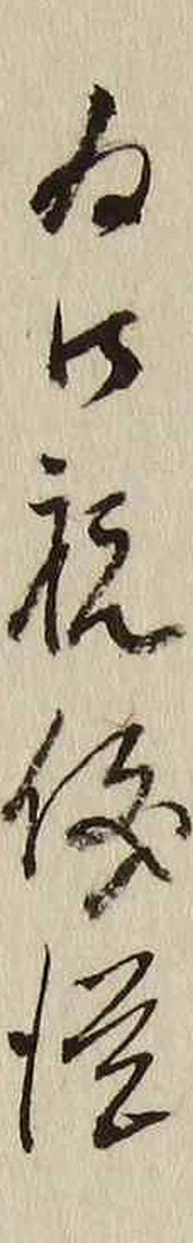為御祝儀従
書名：諸士系譜　巻之351　す之部1
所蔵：会津若松市立会津図書館
